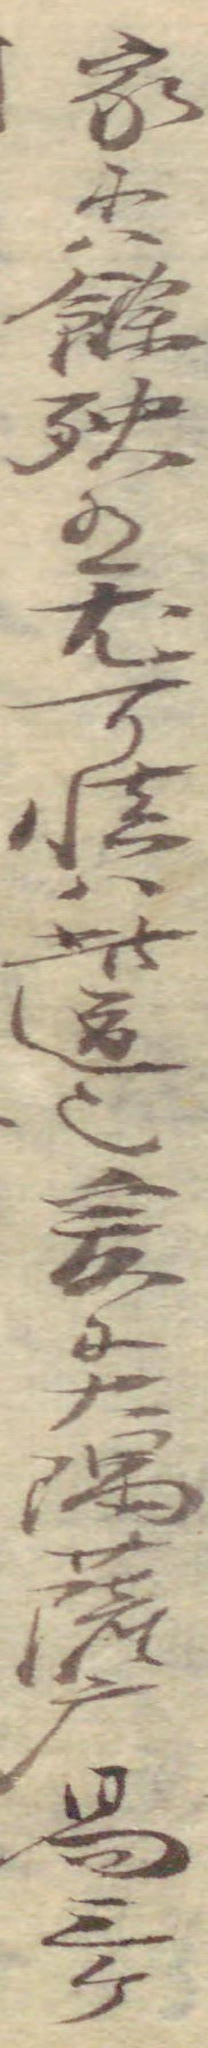家には余殃有尤可慎は此道也爰に大隅薩摩日向三ケ
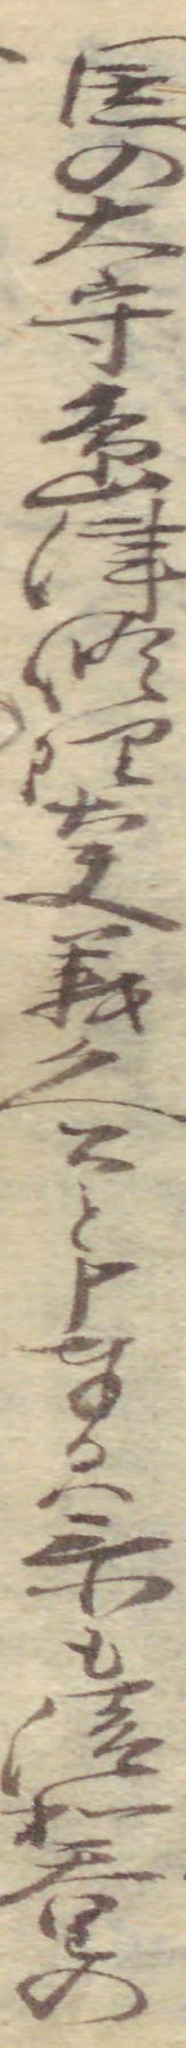国の大守島津修理大夫義久公とも申奉るは忝も清和天皇の
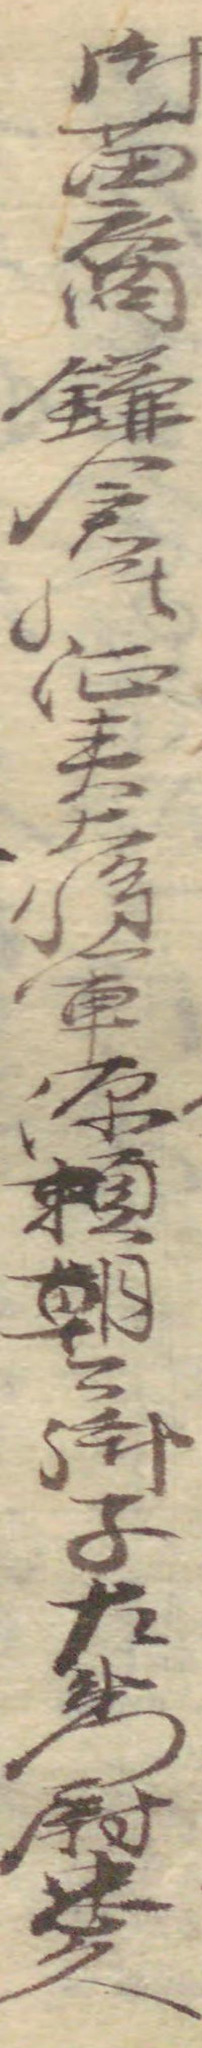御苗裔鎌倉の征夷大将軍源頼朝公御子左衛門尉忠久
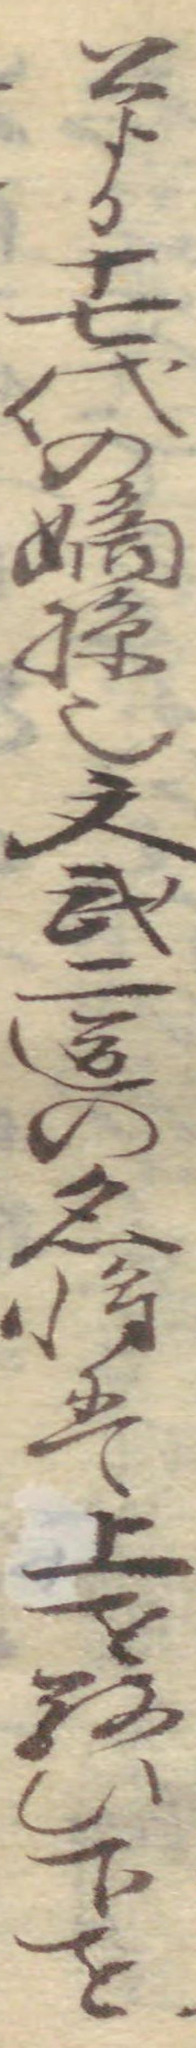公より十七代の嫡孫也文武二道の名将にて上を敬ひ下を
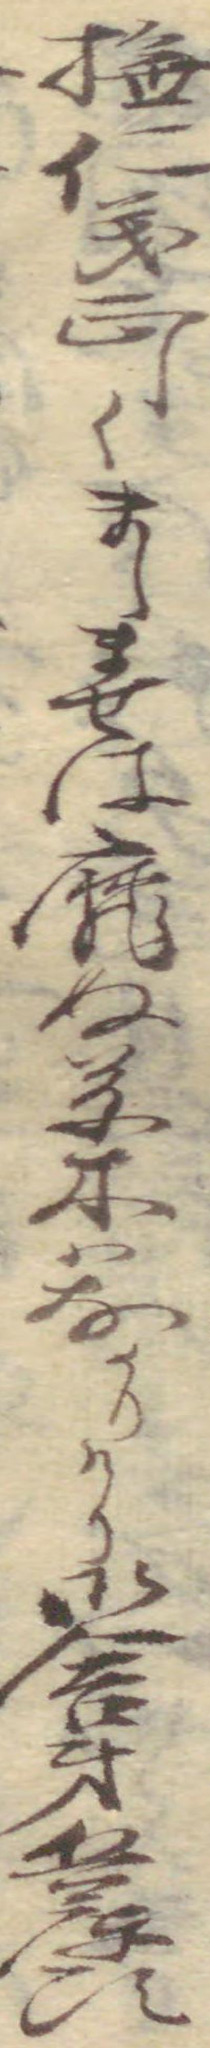撫仁義正しくましませは靡ぬ草木はなかりけり御舎弟兵庫頭
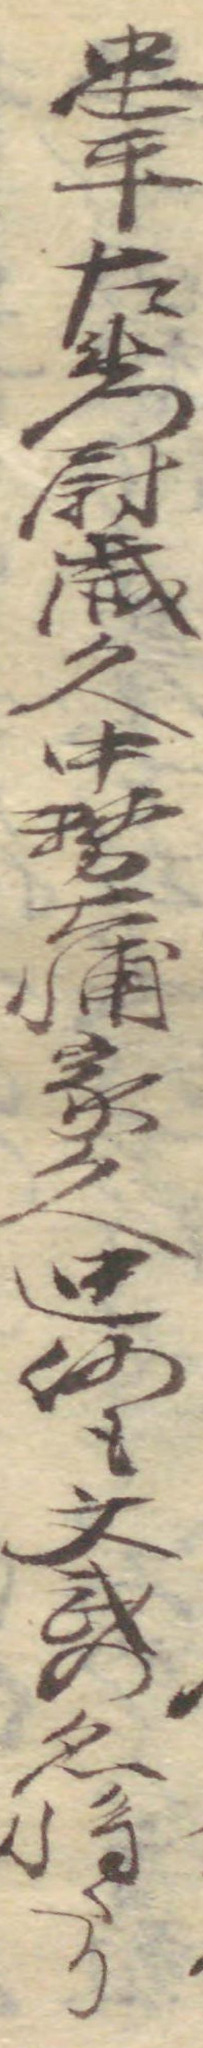忠平左衛門尉歳久中務大輔家久迚何も文武の名将たり
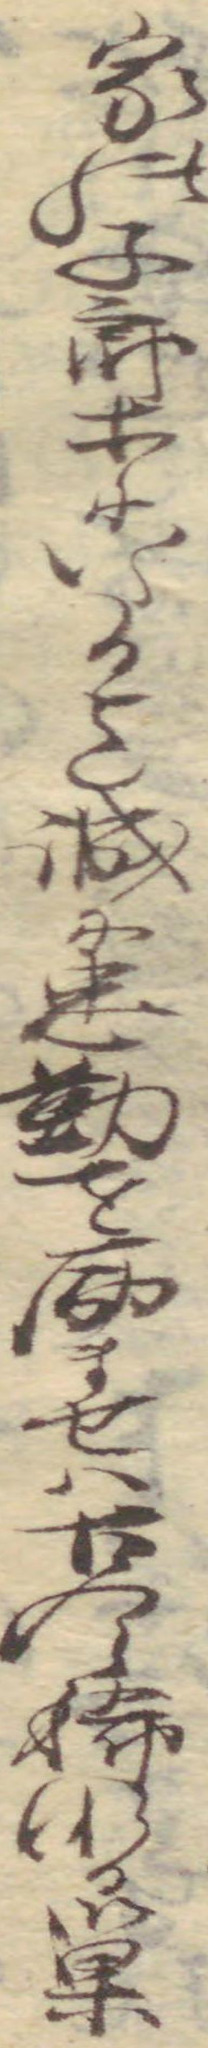家の子郎等にいたる迄誠に忠勤を励ませは古今稀なる御果
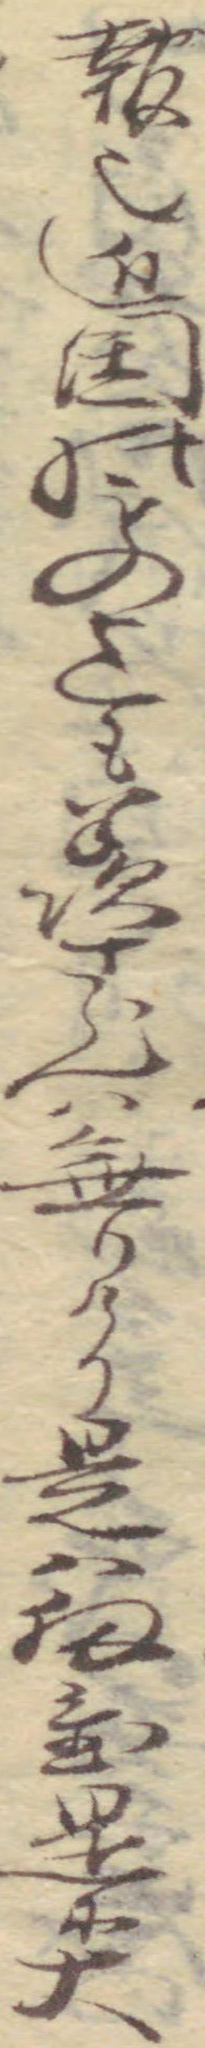報也近国のもの迄も羨さらんは無りけり是は扨置是に大
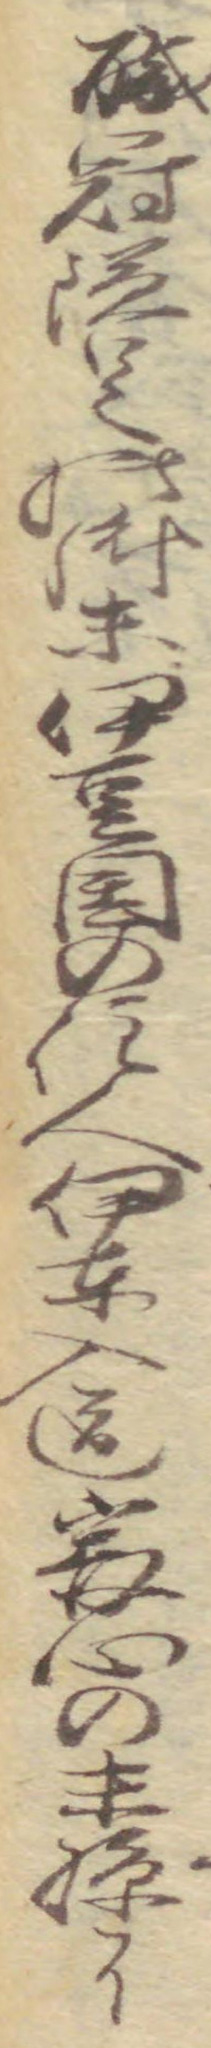職冠鎌足の御末伊豆国の住人伊東入道寂心の末孫に
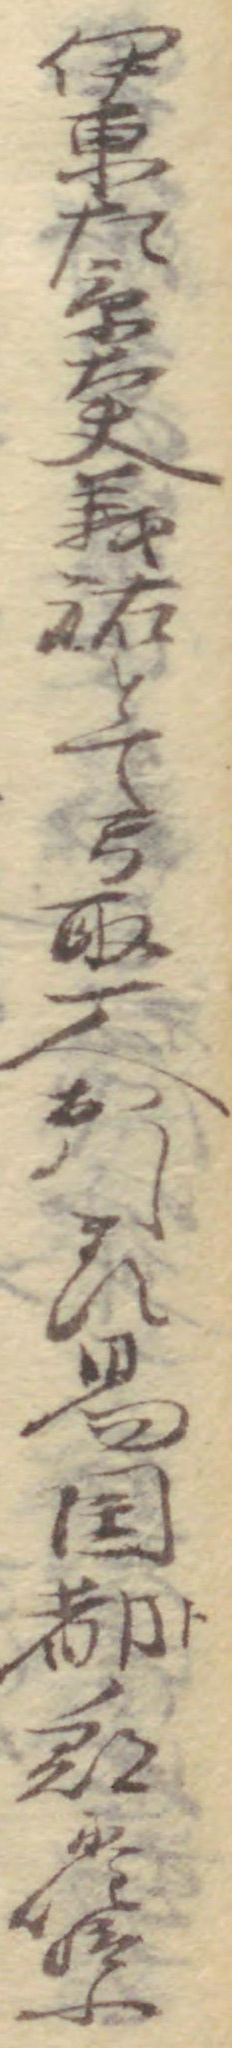伊東左原大夫義祐とて弓取一人おはします日向国都ノ郡に住給ふ
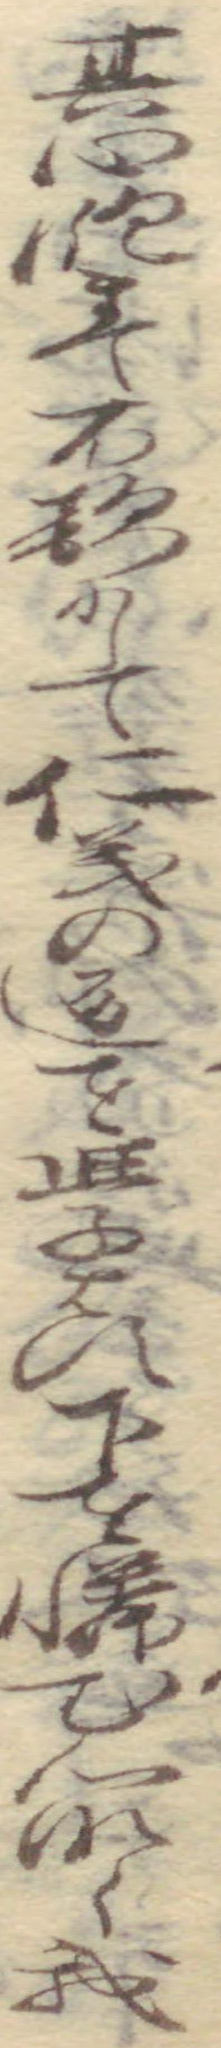其心飽まて不敵にして仁義の道を学はす下を憐む心なく我
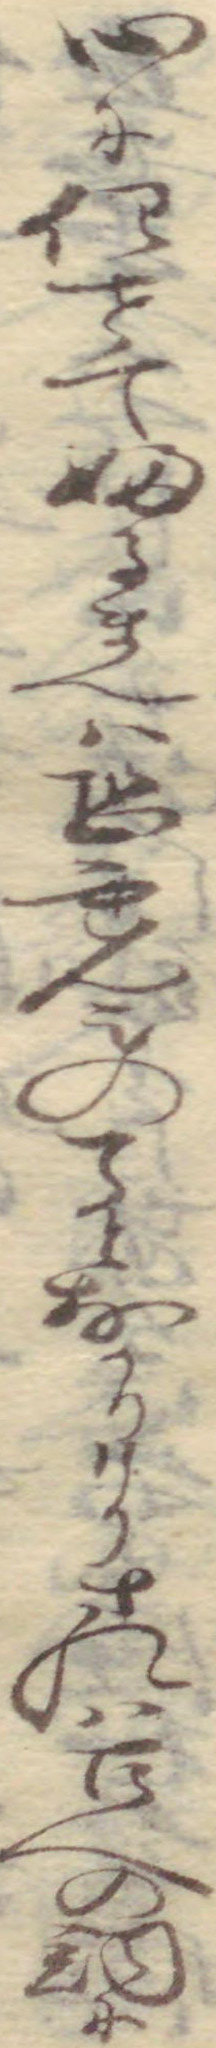心に任せてふるまへは恐れんものともなかりけりされは古への詞に
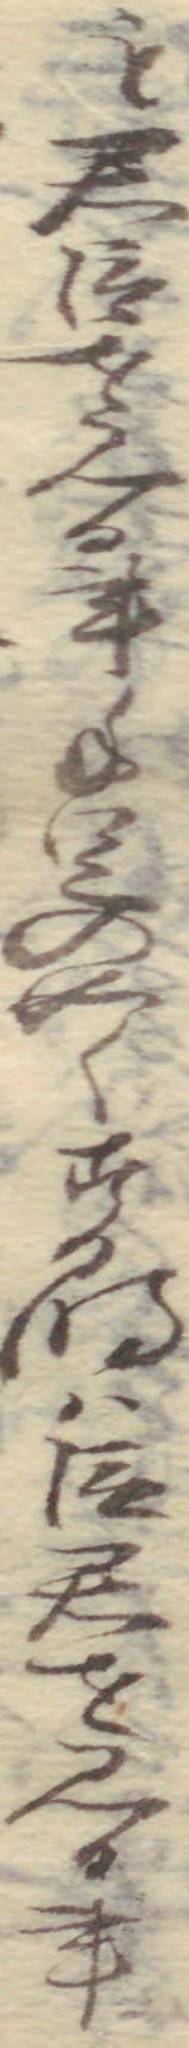も君臣を見る事手足の如くする時は臣君を見る事
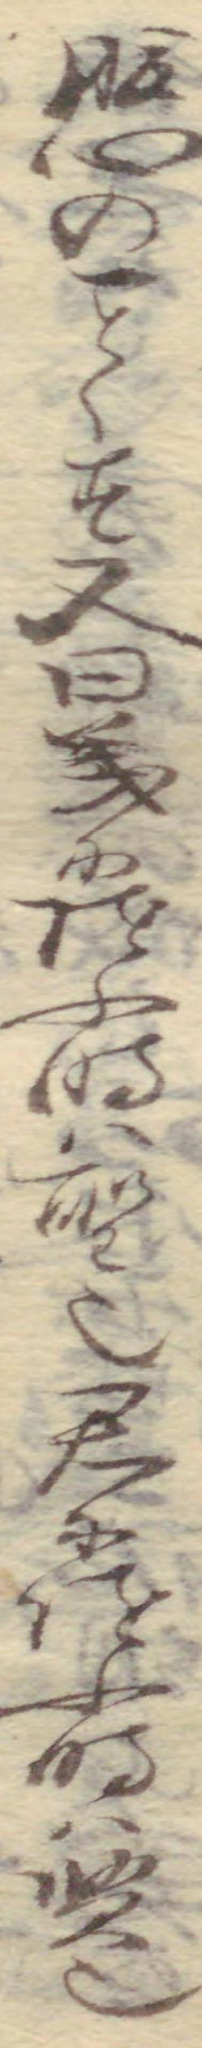腹心のことくす又曰義に隨ふ時は聖也君に隨ふ時は賢也
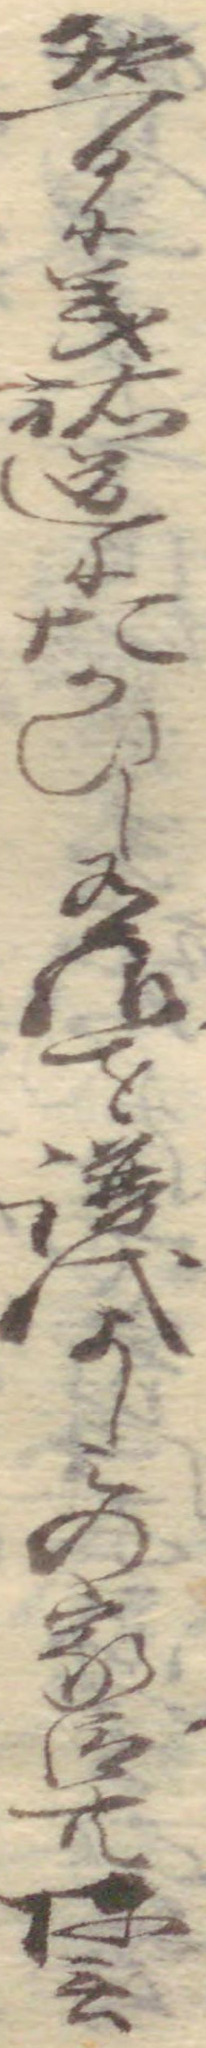然るに義祐道にたかひし有様を譜代よしみの家臣共諫言
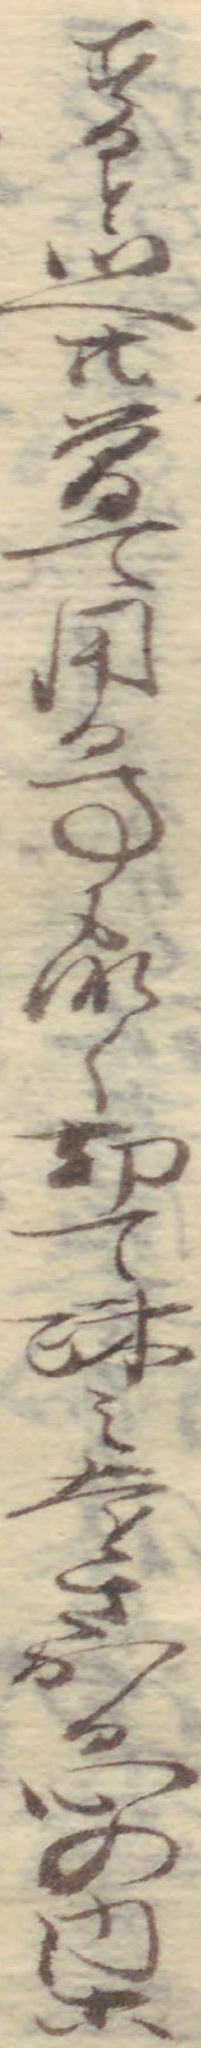するといへ共曽て用る事もなく却て疎み遠さかる心の内等
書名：鶯宿雑記. 巻199-200
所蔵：国立国会図書館 National Diet Library, JAPAN
